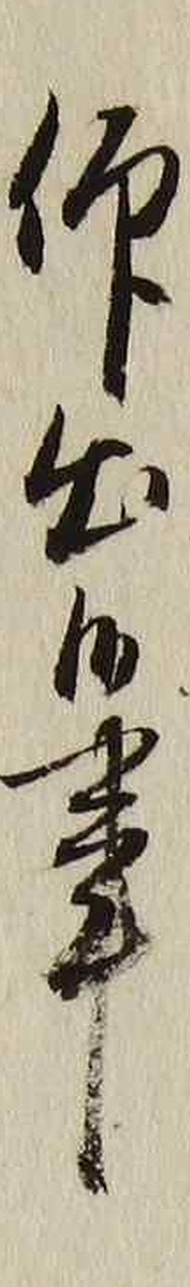仰出候事
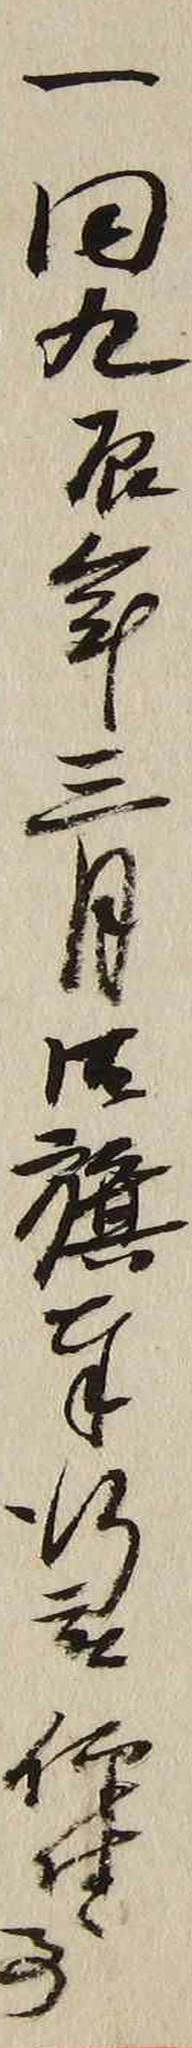一同九辰年三月御旗奉行被仰付候事
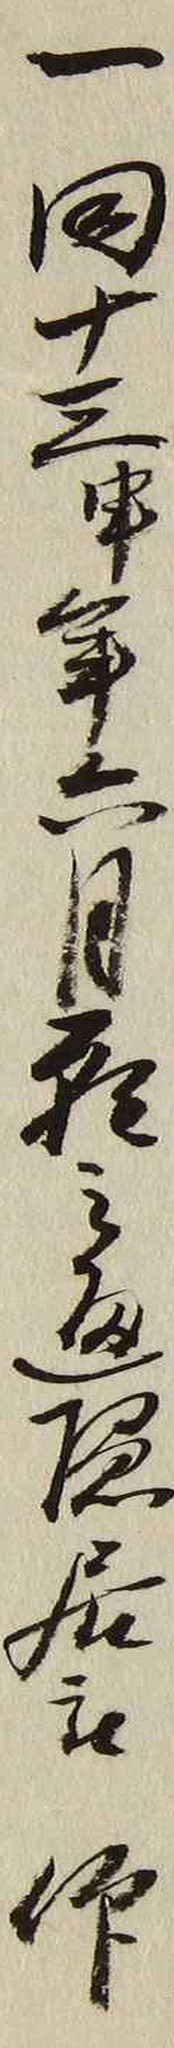一同十三申年六月願之通隠居被仰
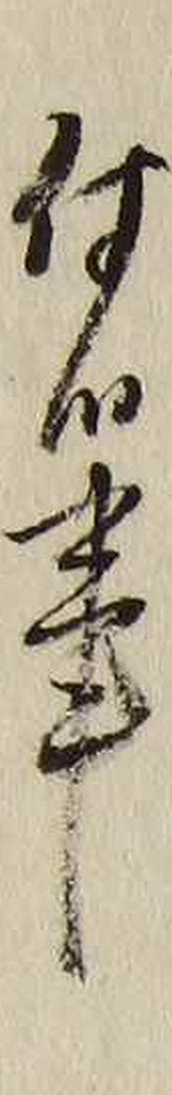付候事
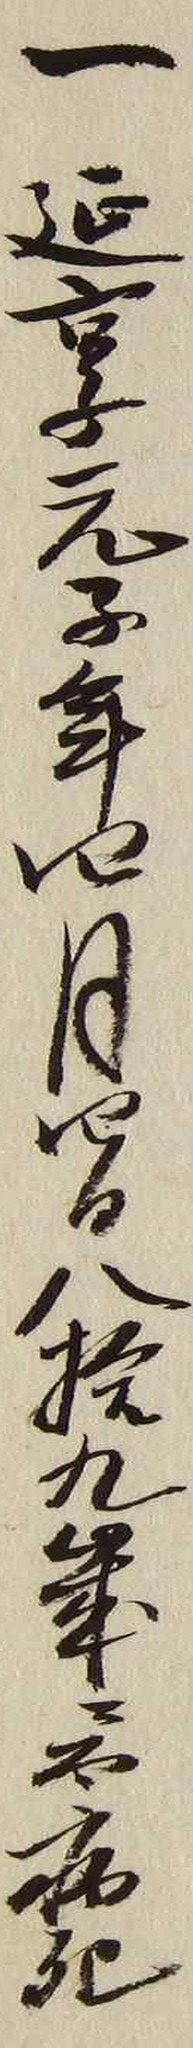一延享元子年四月四日八拾九歳ニ而病死

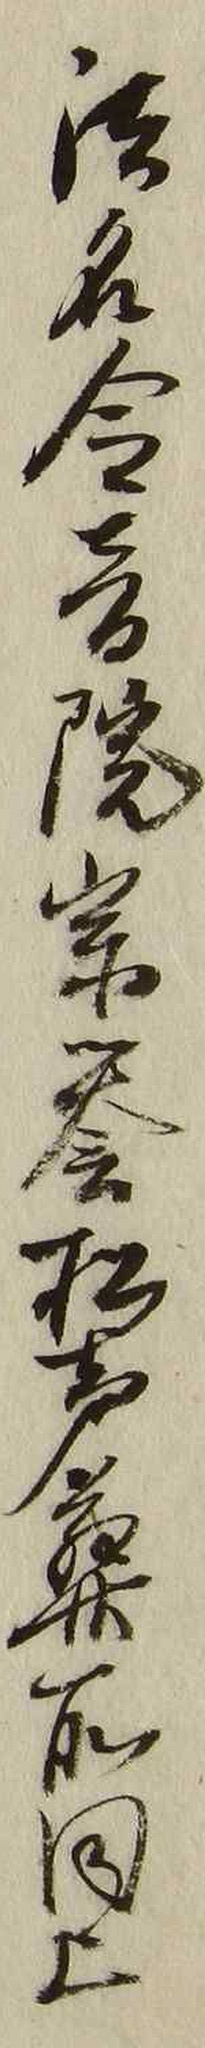法名令音院宗誉松声葬所同上
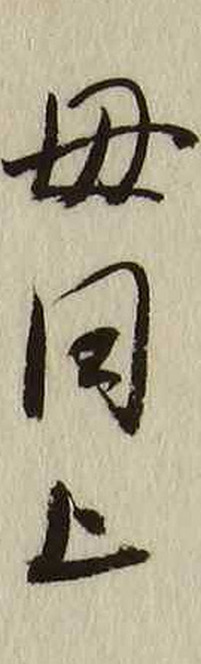母同上
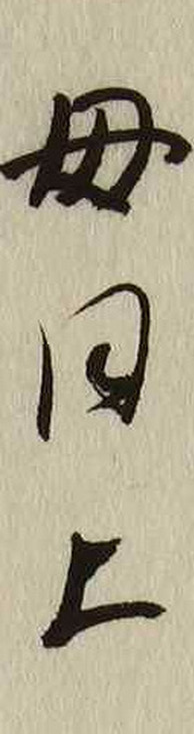母同上
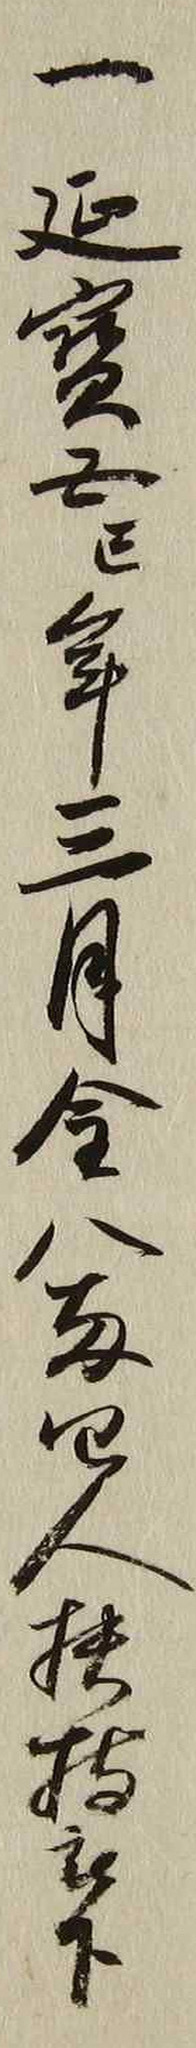一延宝五巳年三月金八両四人独持被下
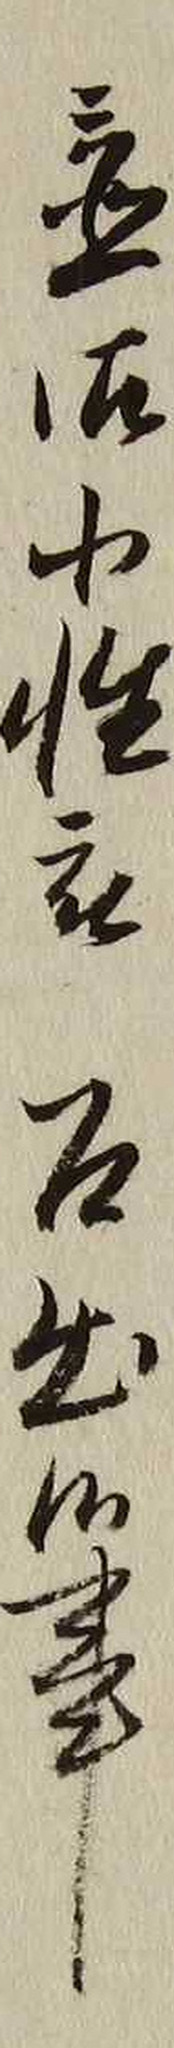置御小性被召出候事
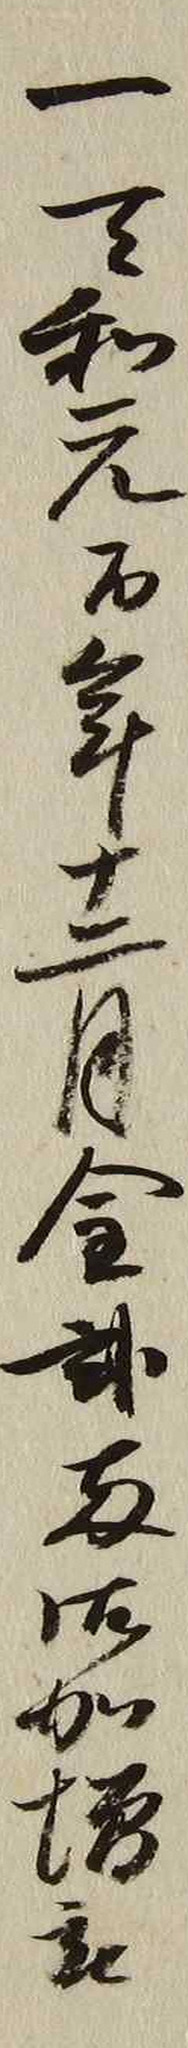一天和元酉年十二月金弐両御加増被
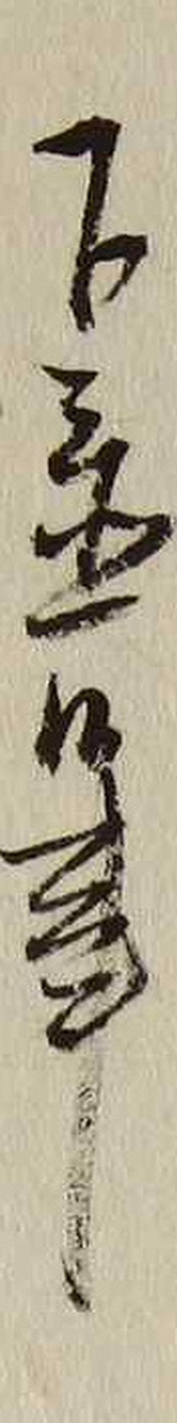下置候事
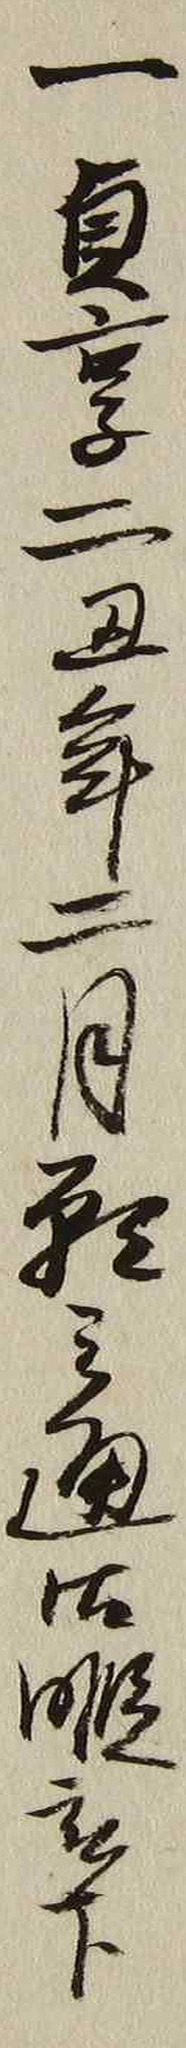一貞享二丑年二月願之通御暇被下
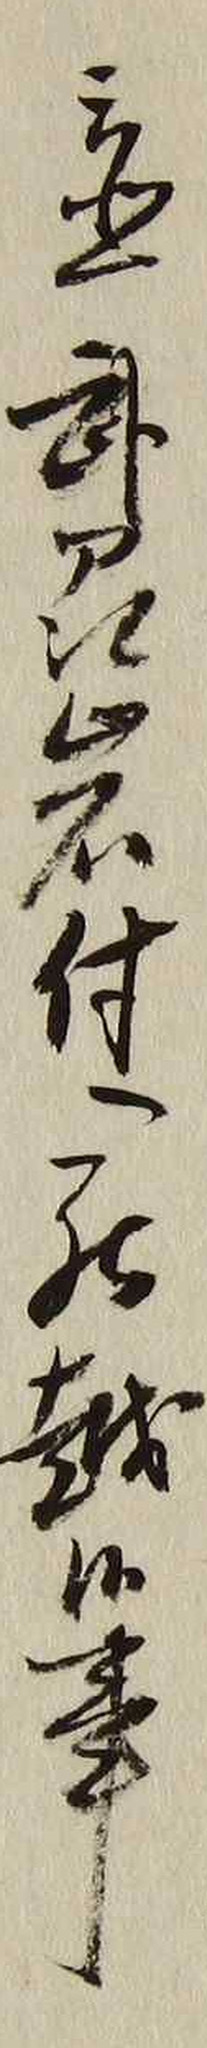置武州岩付へ罷越候事
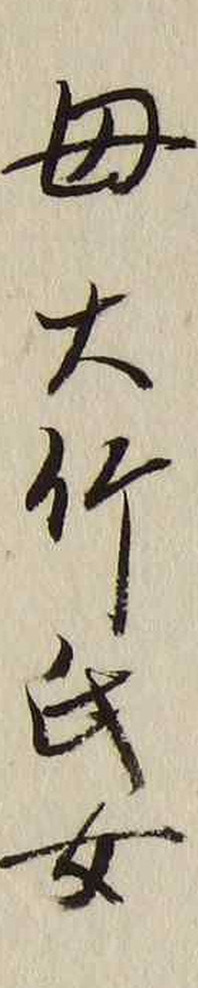母大竹氏女

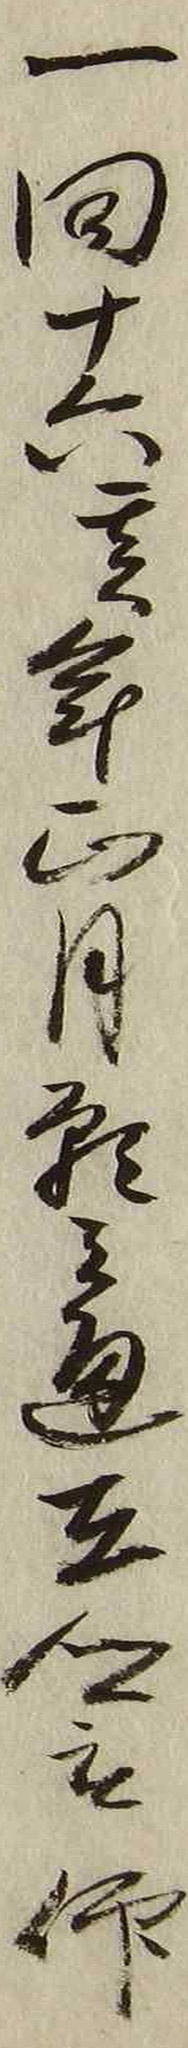一同十六亥年正月願之通在郷被仰
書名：諸士系譜　巻之356　す之部6
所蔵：会津若松市立会津図書館
